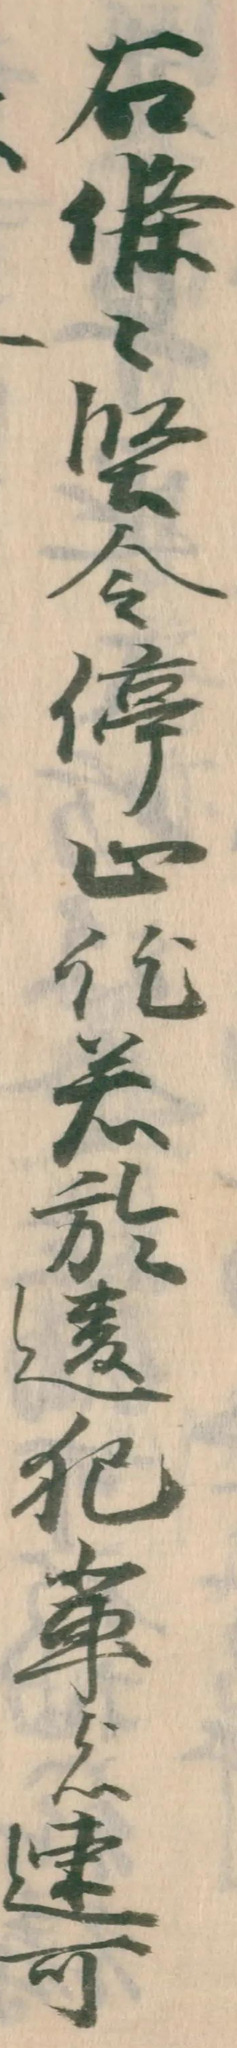右条々堅令停止訖若於違犯輩者速可
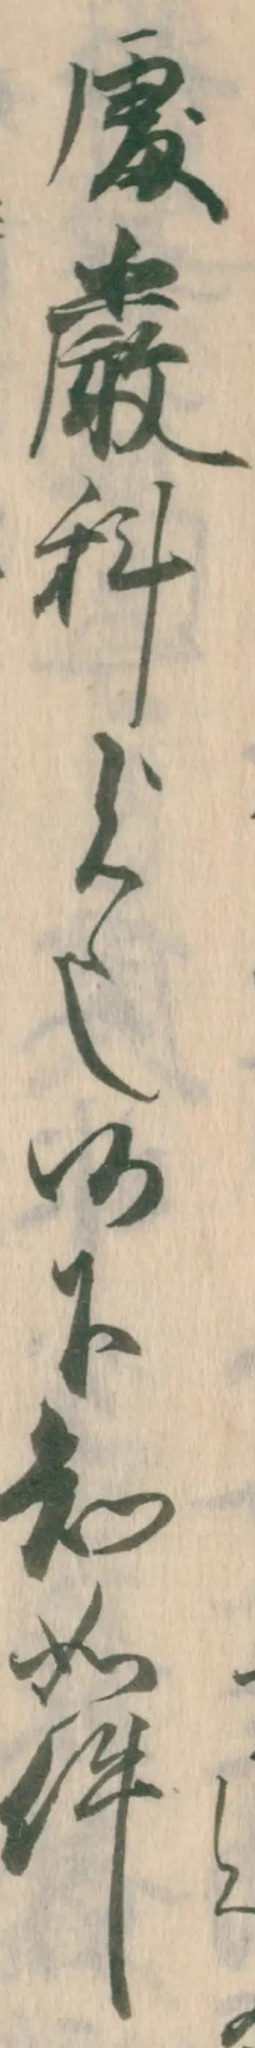処厳科者也仍下知如件
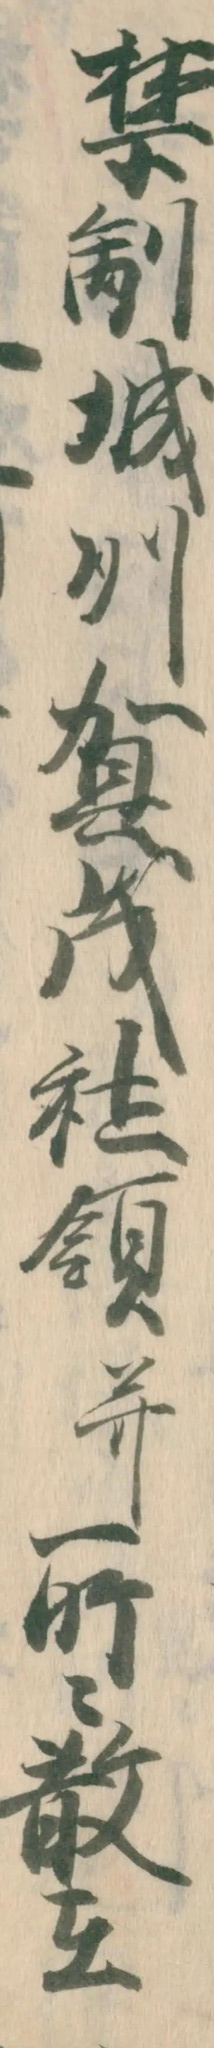禁制城州賀茂社領并所々散在

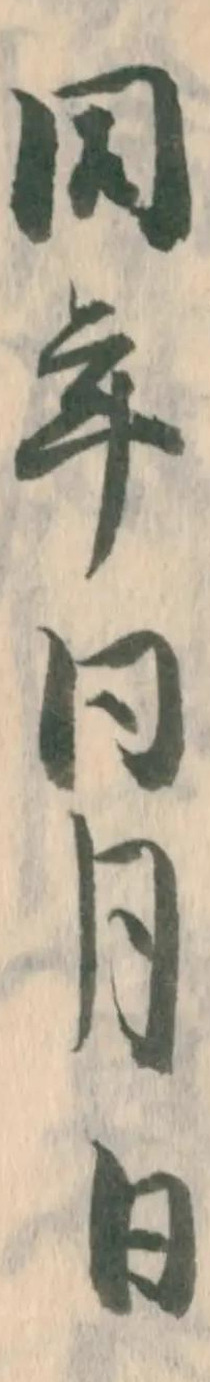同年同月日
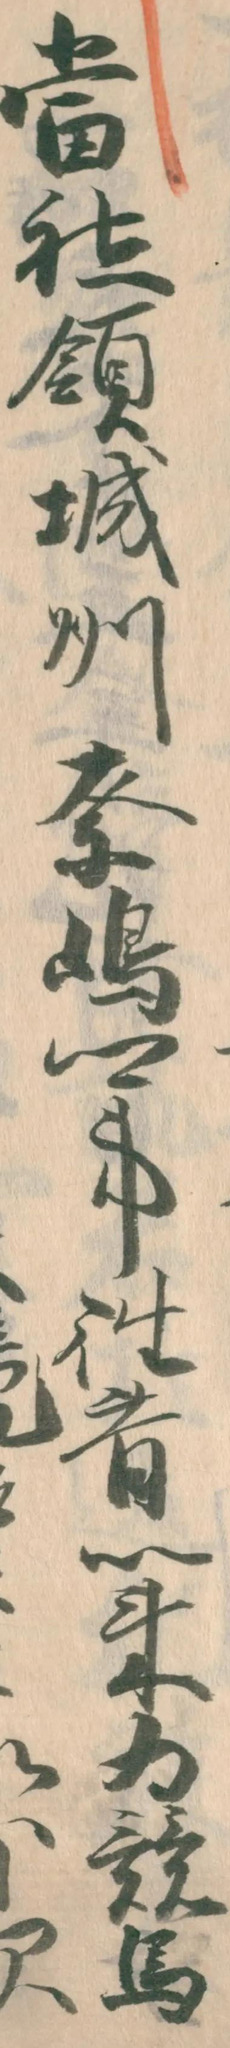当社領城州奈嶋郷事往昔以来為競馬
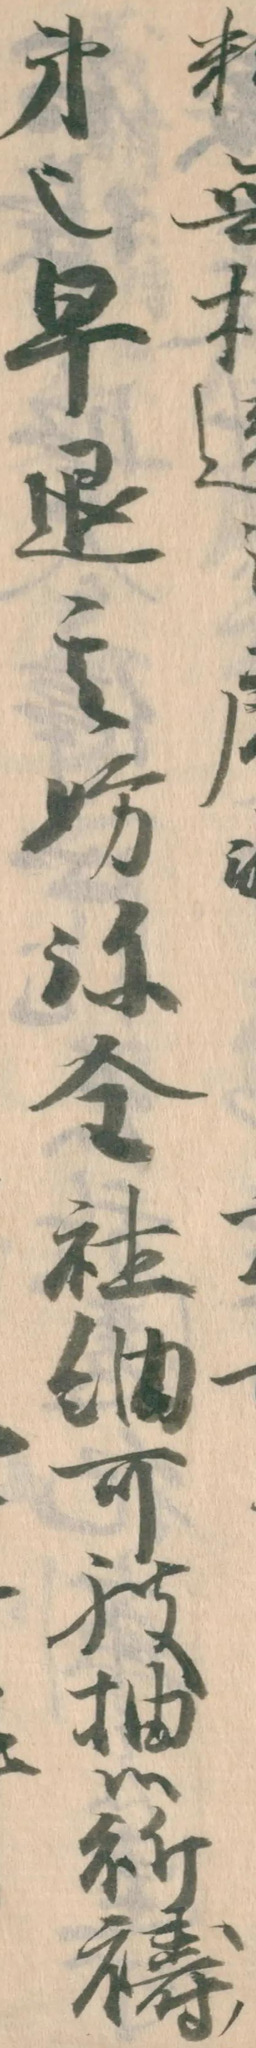第也早退其妨弥全社納可被抽御祈祷
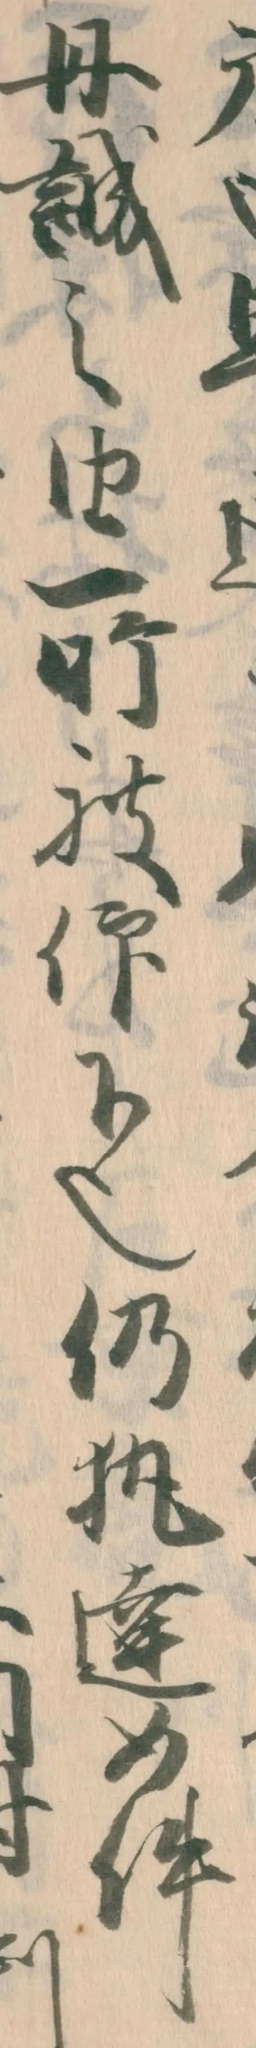丹誠之由所被仰下也仍執達如件
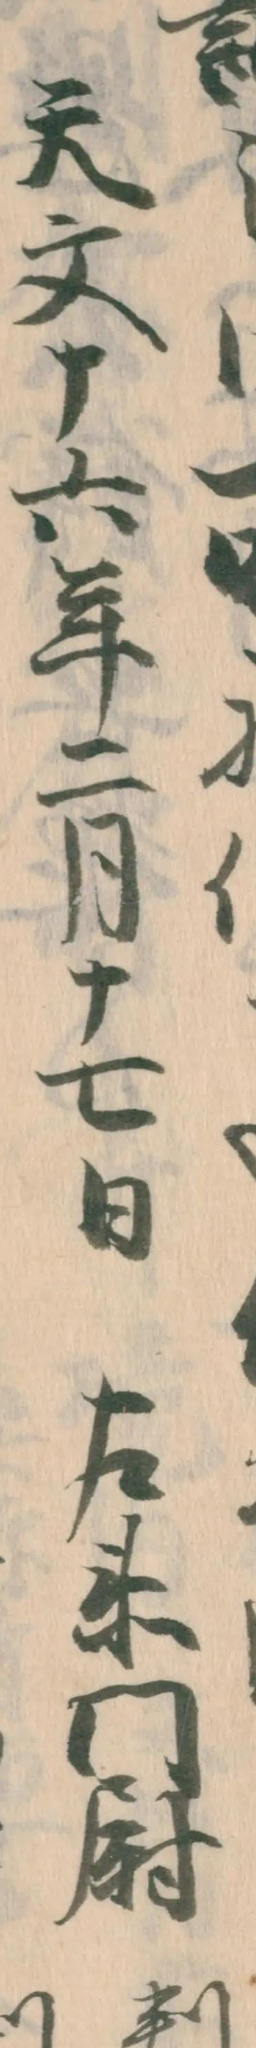天文十六年二月十七日左衛門尉判
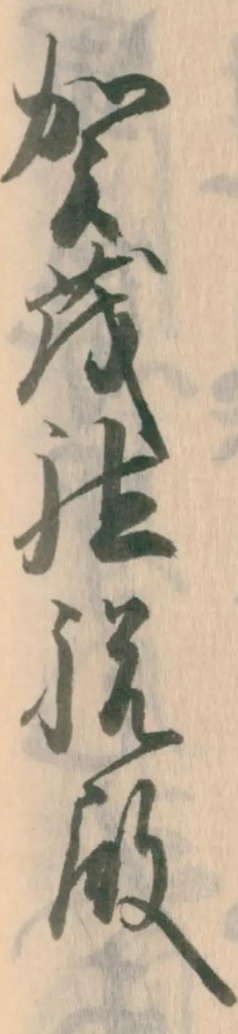賀茂社祝殿
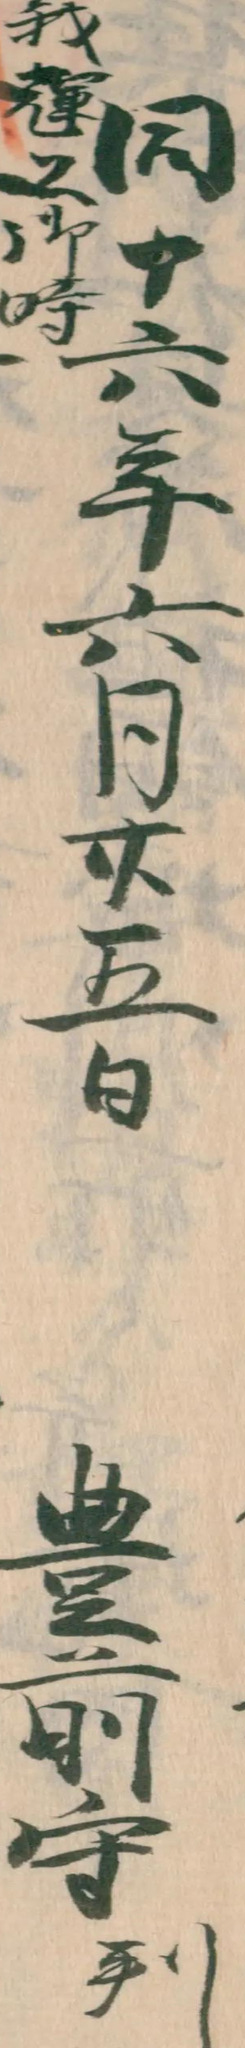同十六年六月廿五日豊前守判
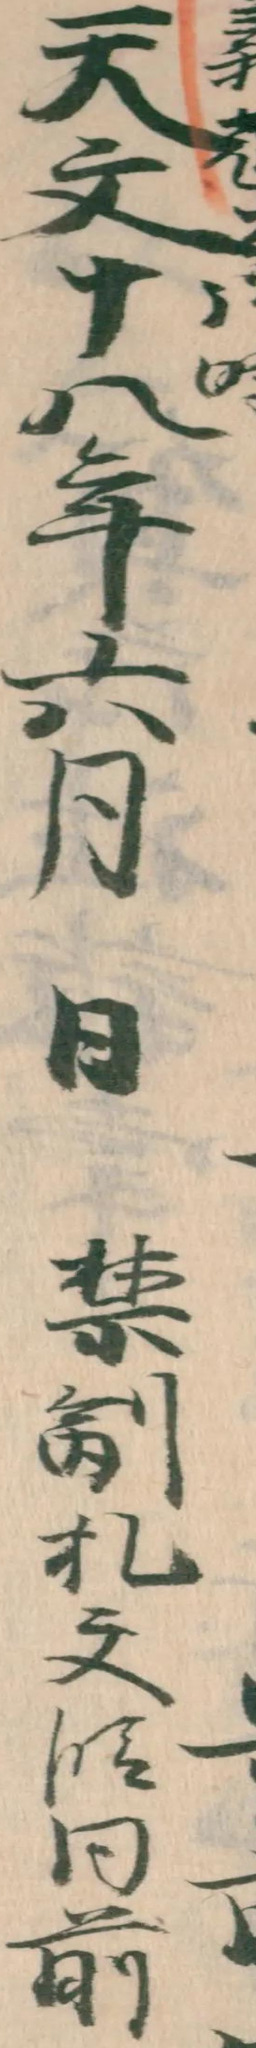天文十八年六月日禁制札文段同前
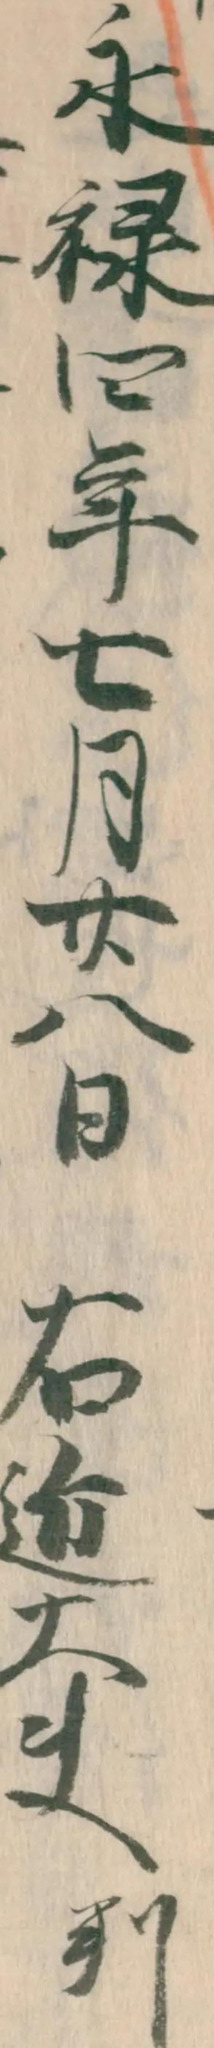永禄四年七月廿八日右近大夫判

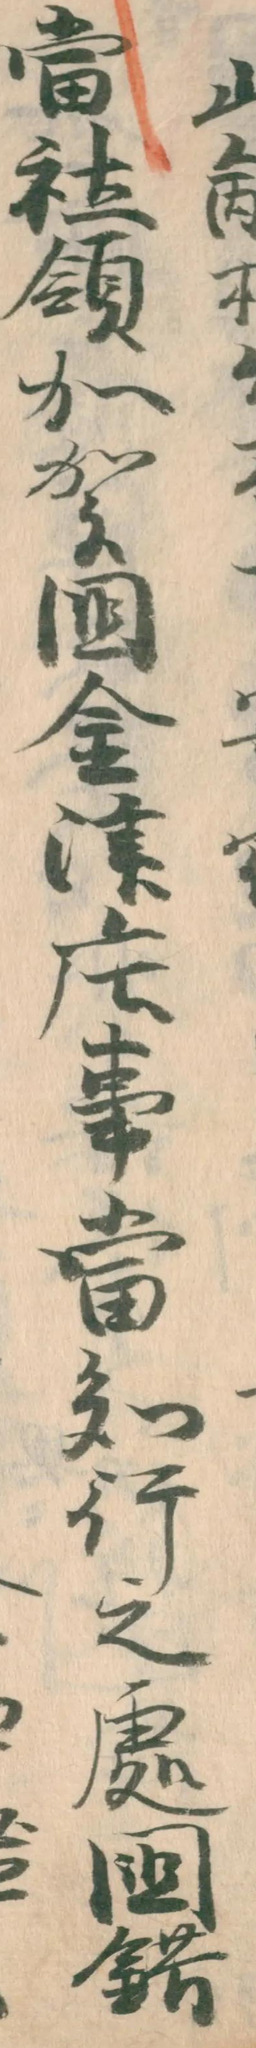当社領加賀国金津庄事当知行之処国錯
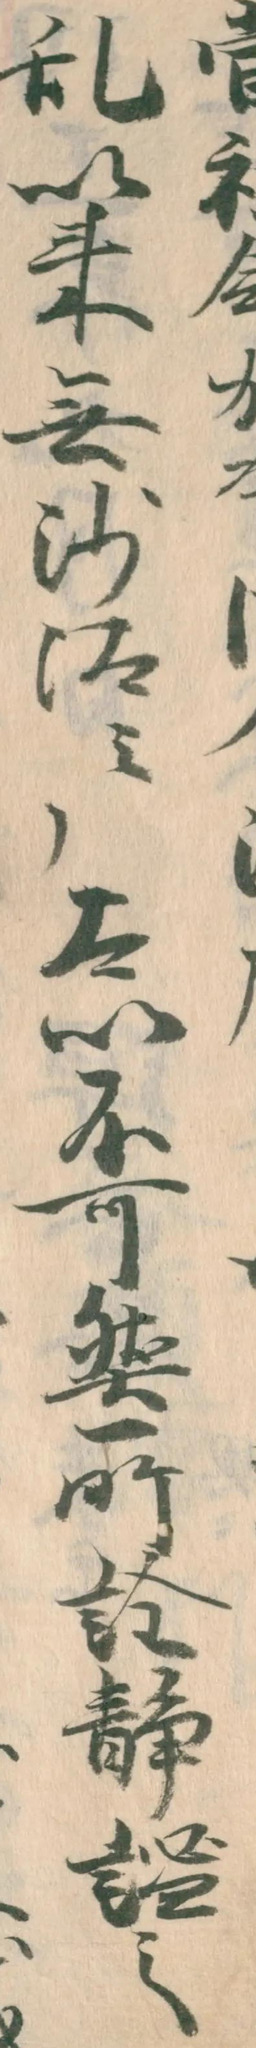乱以来無沙汰云々太以不可然所詮静謐之
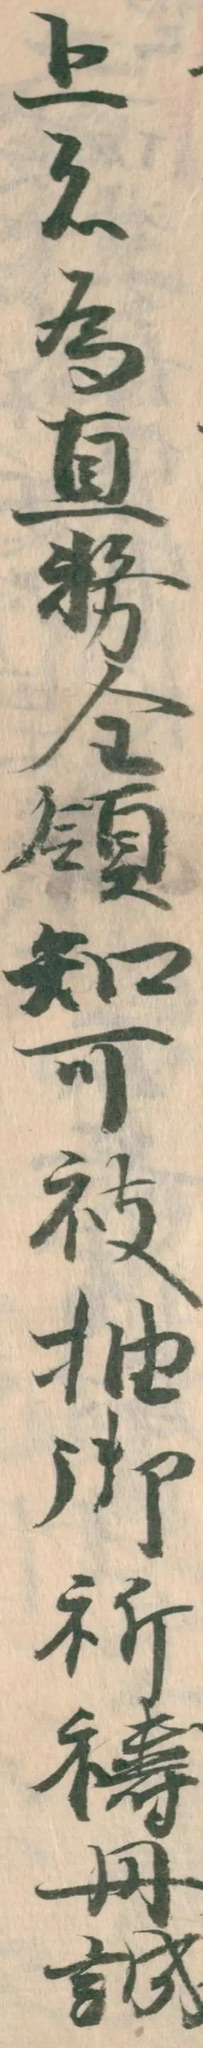上者為直務全領知可被抽御祈祷丹誠
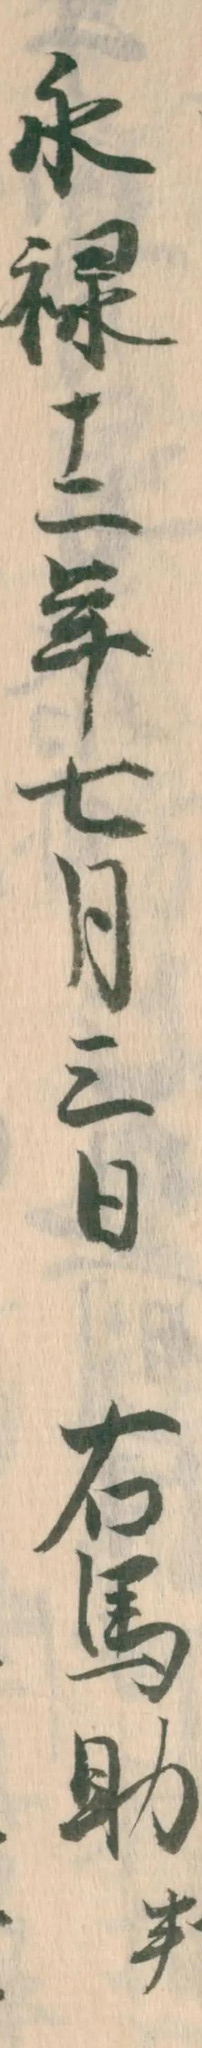永禄十二年七月三日右馬助判
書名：賀茂社記録. 第1冊
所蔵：国立国会図書館 National Diet Library, JAPAN
